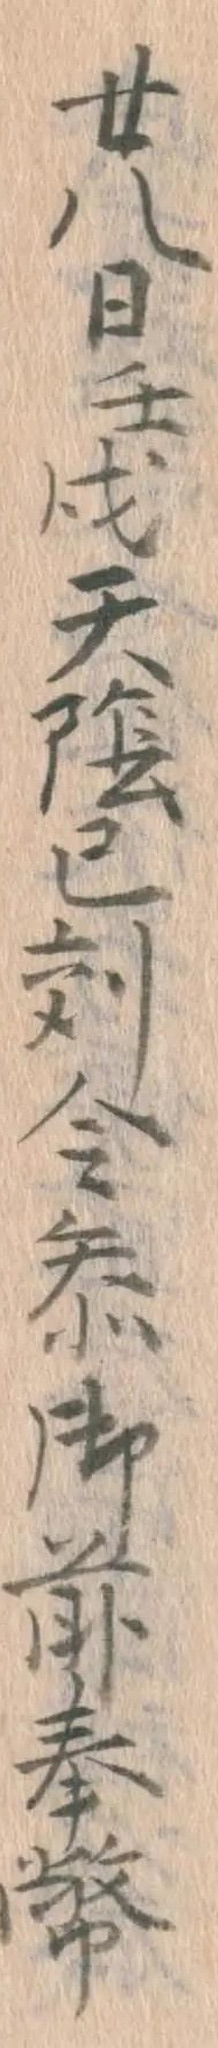廿八日壬戌天陰已刻令参御前奉幣
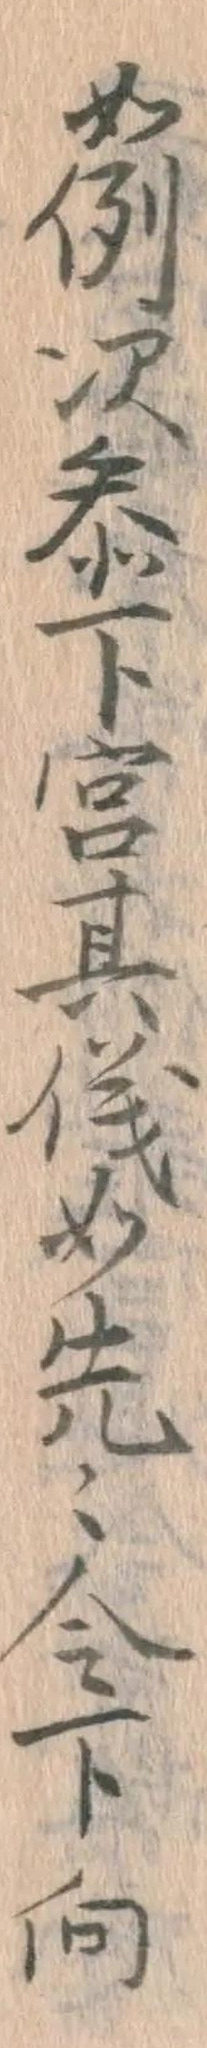如例次参下宮其儀如先々令下向
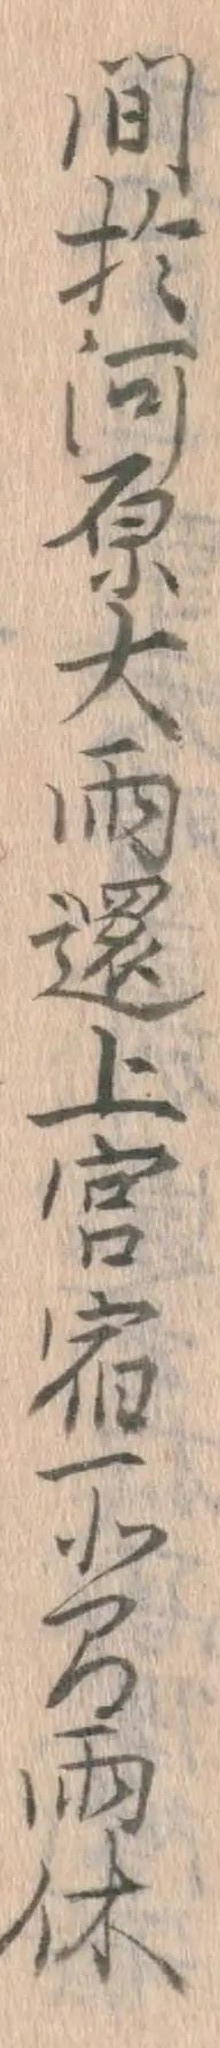間於河原大雨還上宮宿所間雨休
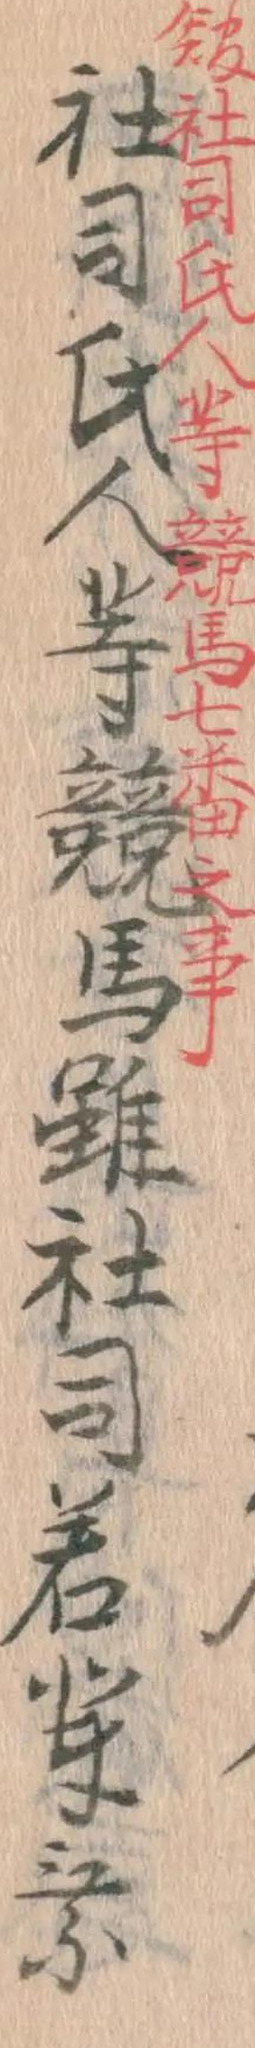社司氏人等競馬雖社司若輩乗
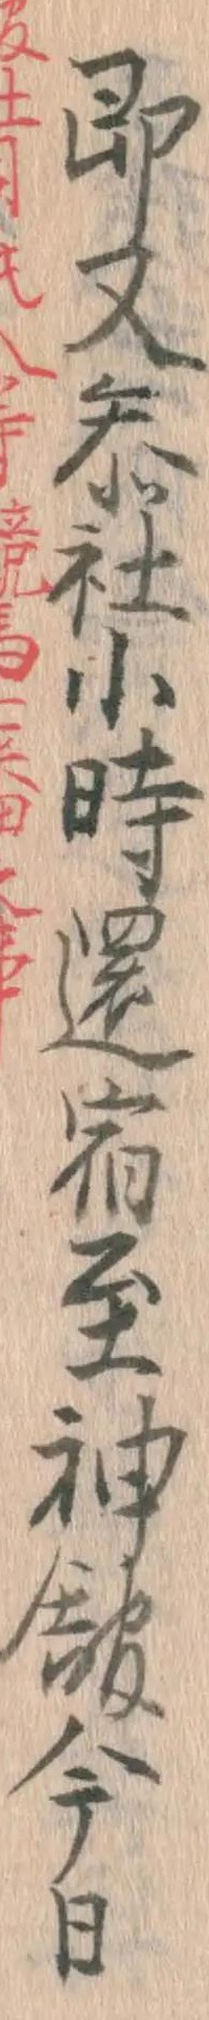即文参社小時還宿至神館今日
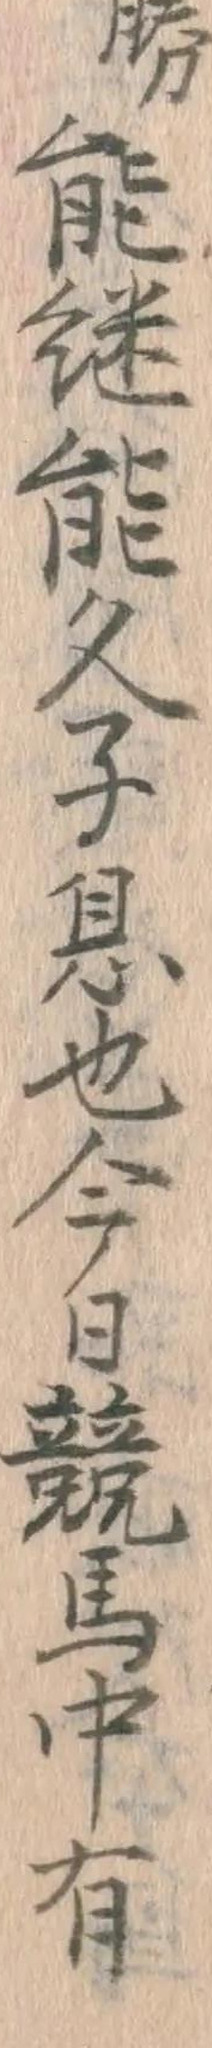勝能継能久子息也今日競馬中有
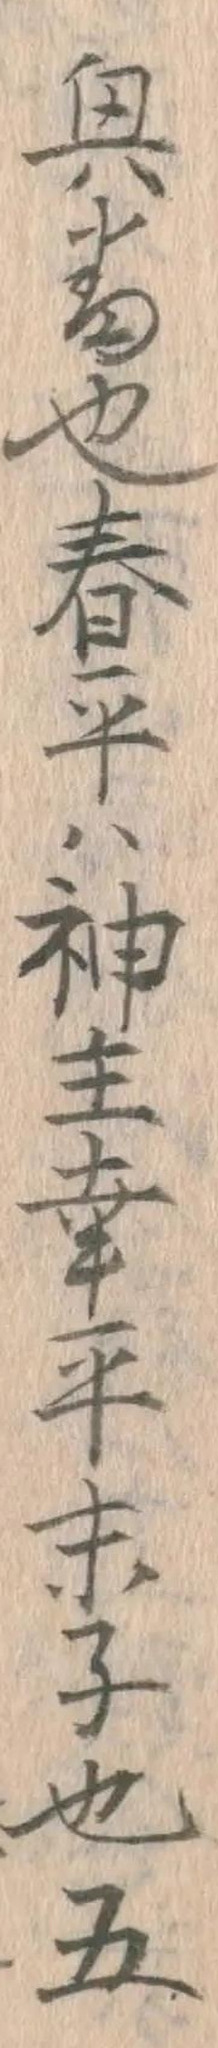興番也春平ハ神主幸平末子也五
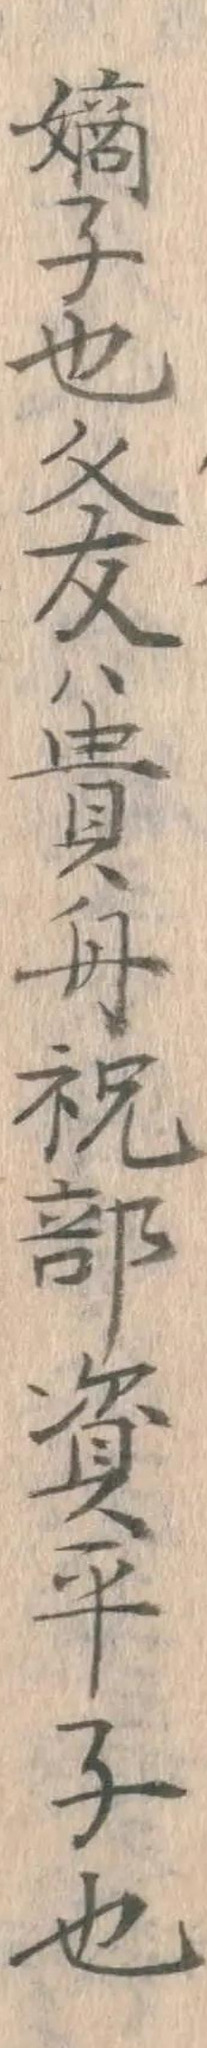嫡子也久友ハ貴舟祝部資平子也
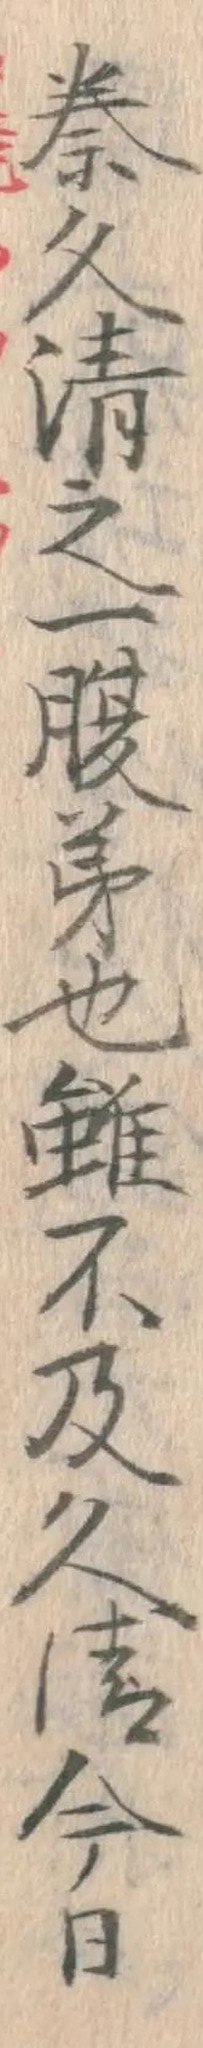秦久清之一腹弟也雖不及久清今日
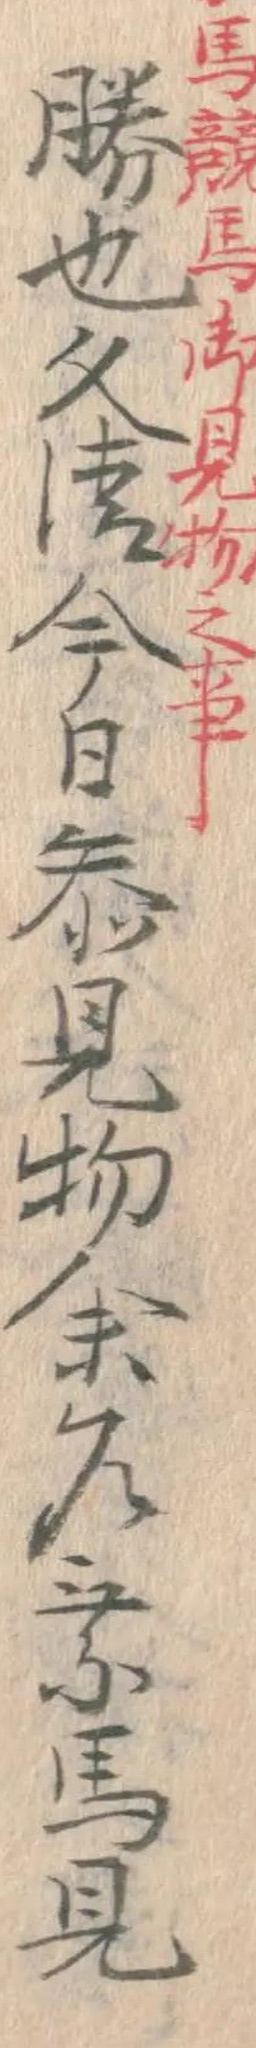勝也久清今日参見物余乍乗馬見
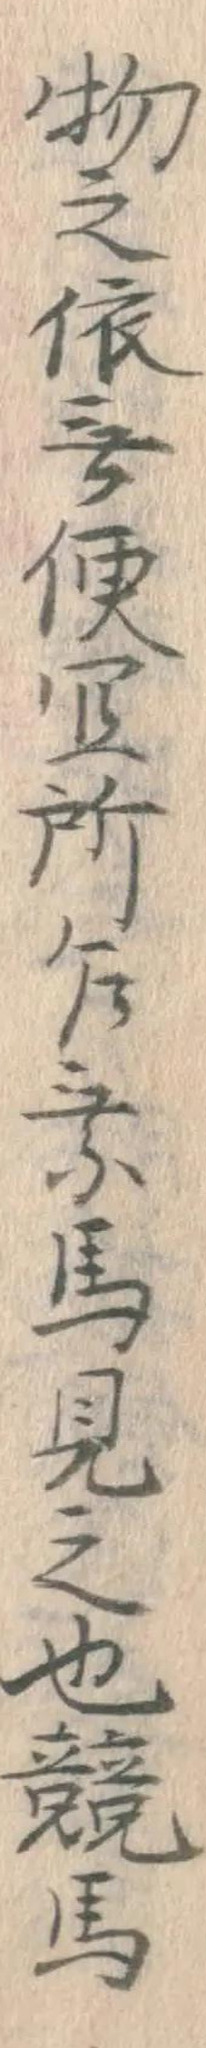物之依無便宜所乍乗馬見之也競馬
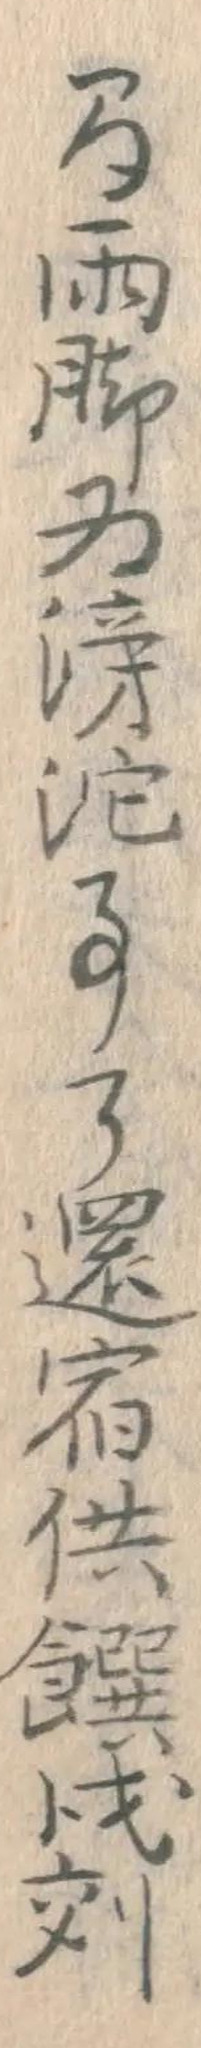間雨脚為滂沱事了還宿供饌戌刻
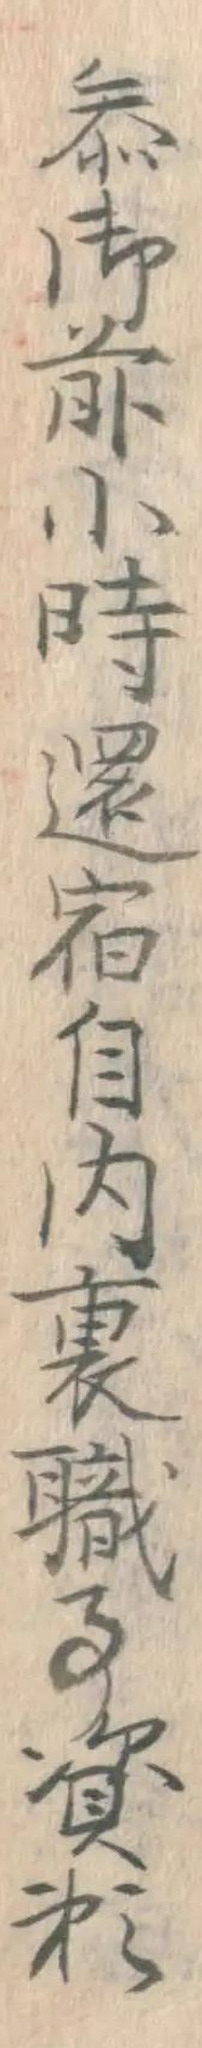参御前小時還宿自内裏職事資頼

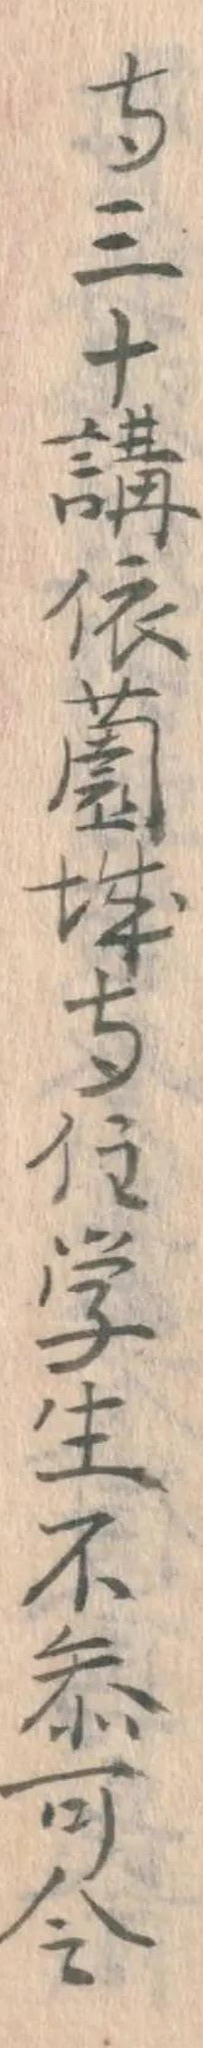寺三十講依薗城寺住学生不参可令
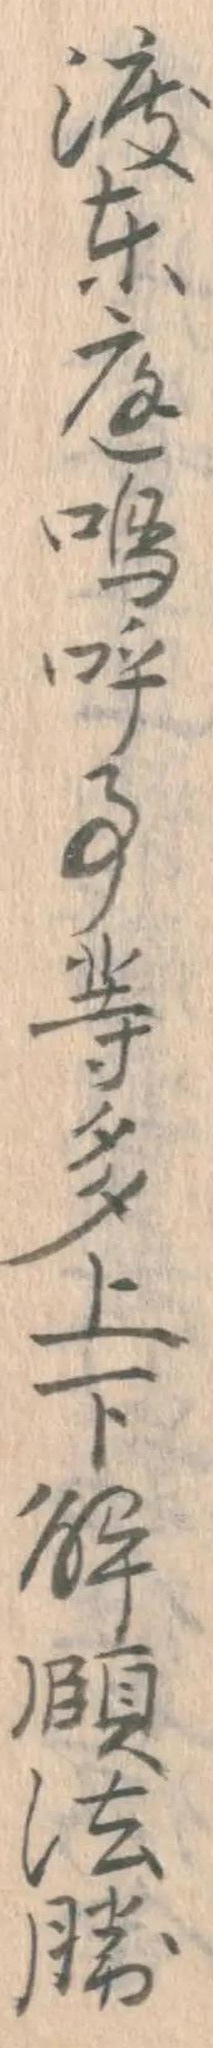渡東庭鳴呼事等多上下解頤法勝
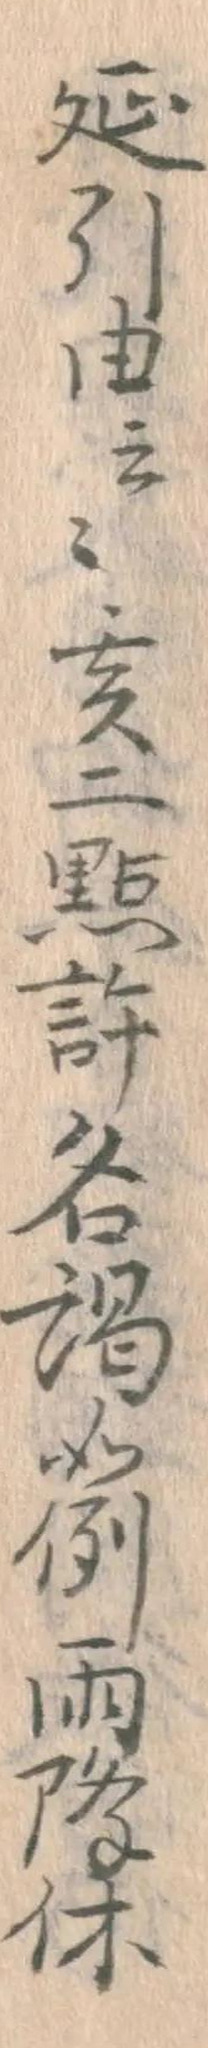延引由云々亥二点許各謁如例雨降休
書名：賀茂社記録. 第80冊
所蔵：国立国会図書館 National Diet Library, JAPAN
